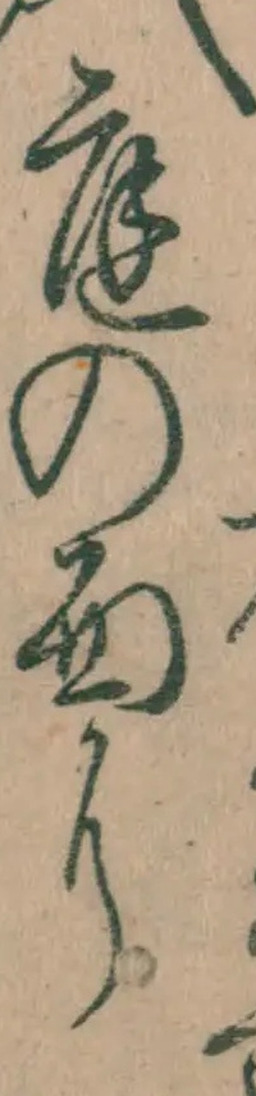庭の面に
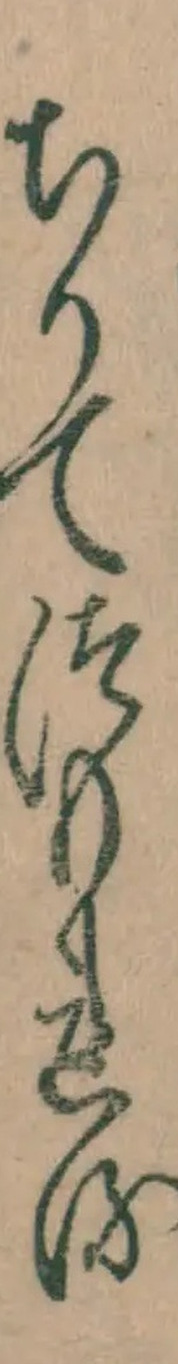ちりてつもれる
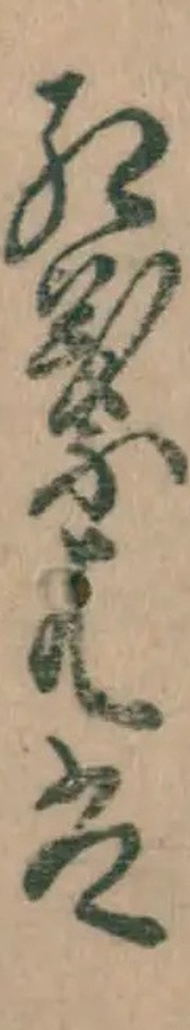紅葉はは
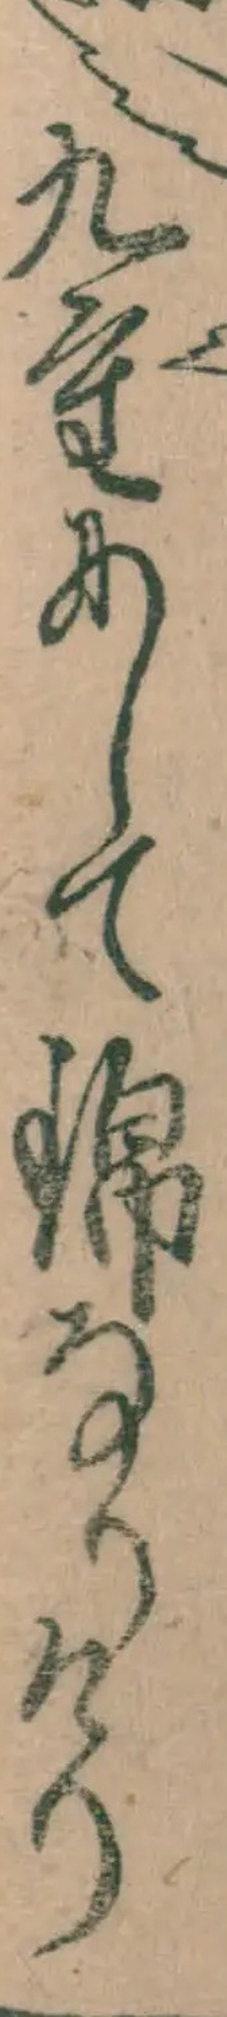九重にして錦なりけり
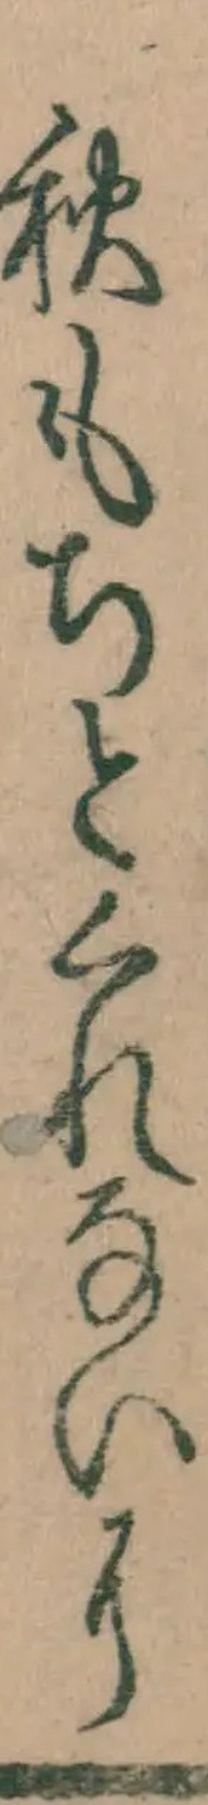秋もちとくれないに
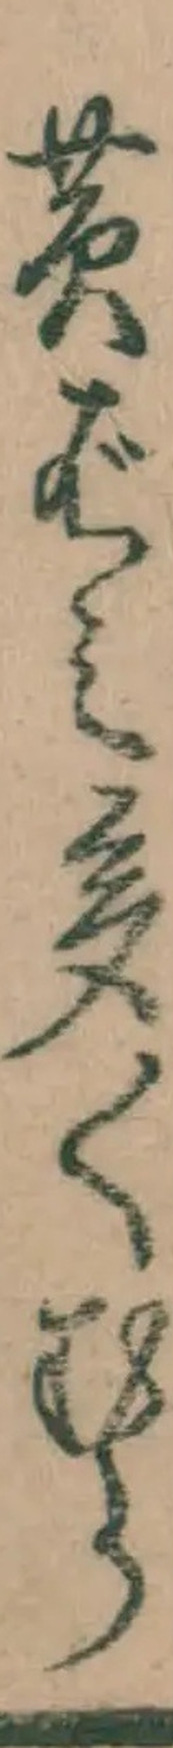黄ばみ多くむら
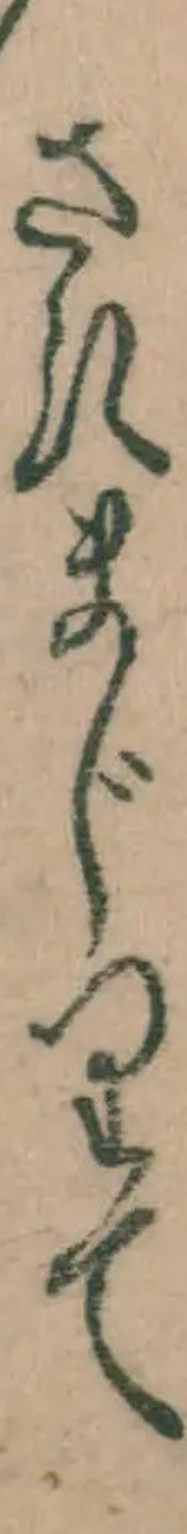さきまじりて
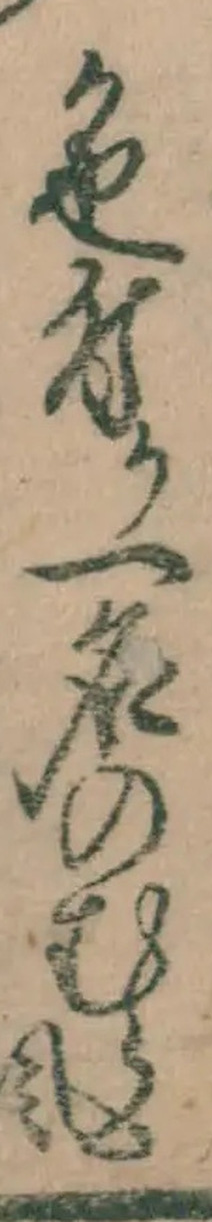色付一名のむら
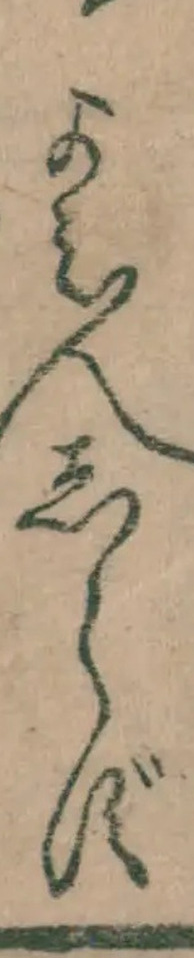よみ人しらず
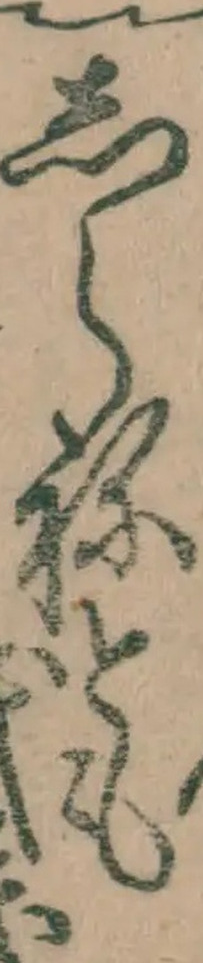しらねとも
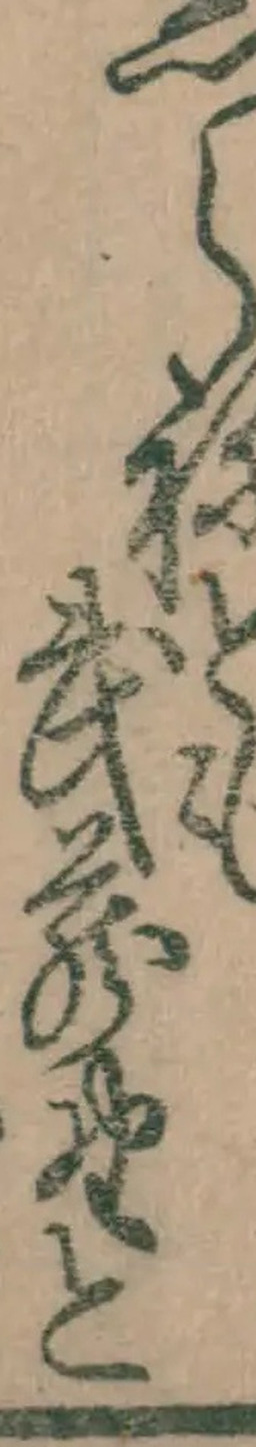武蔵野と
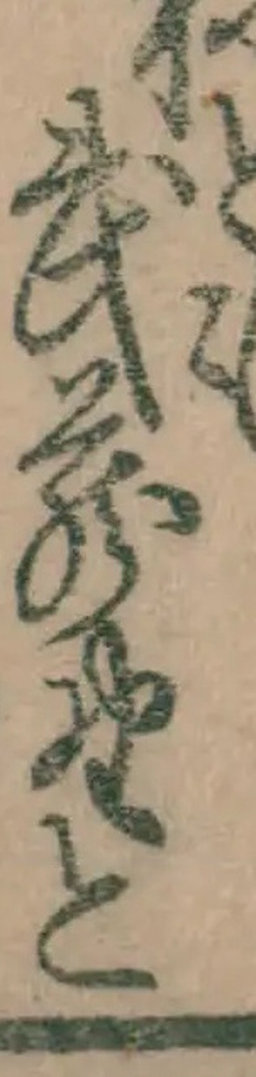武蔵野と
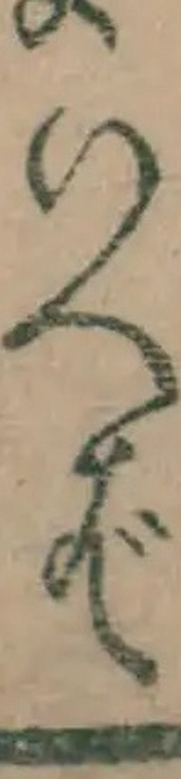いへば
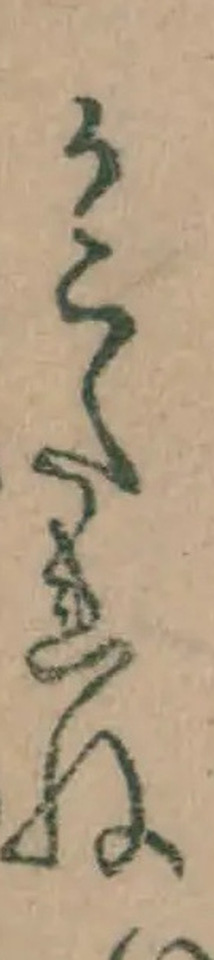かこたれぬ
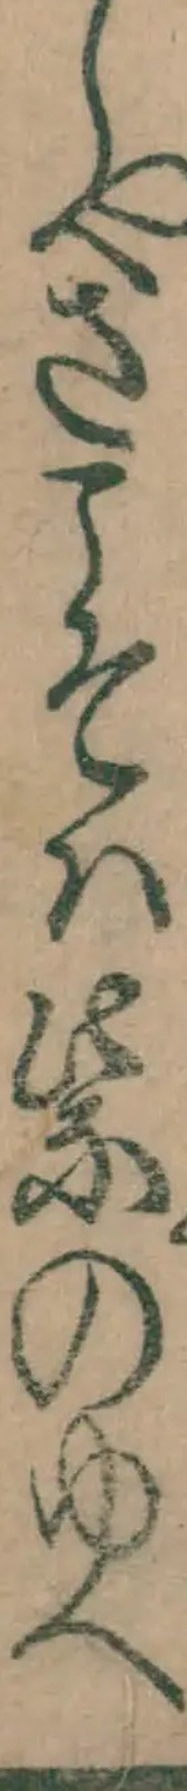よしやさこそは紫のゆへ

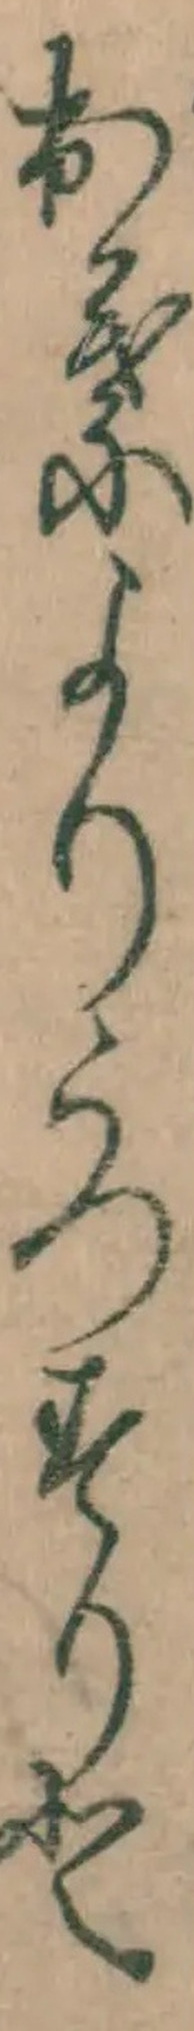出葉よりうつすりと
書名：紅葉集
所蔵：国立国会図書館 National Diet Library, JAPAN
